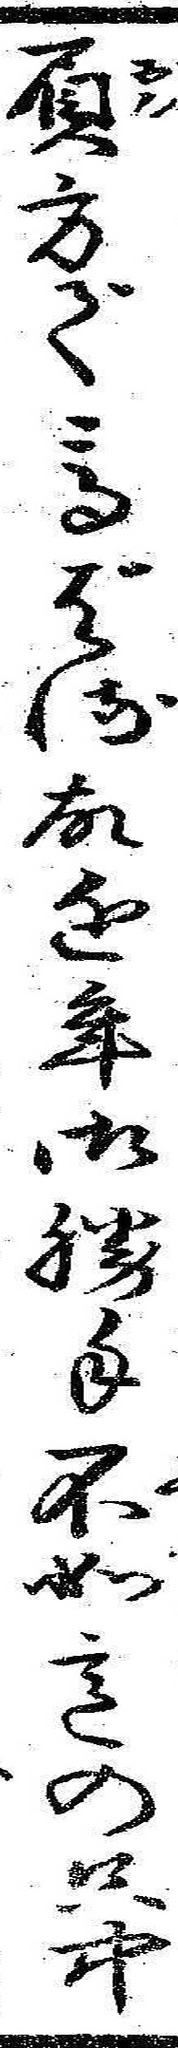負方で高ばる故近年御勝手不如意の只中
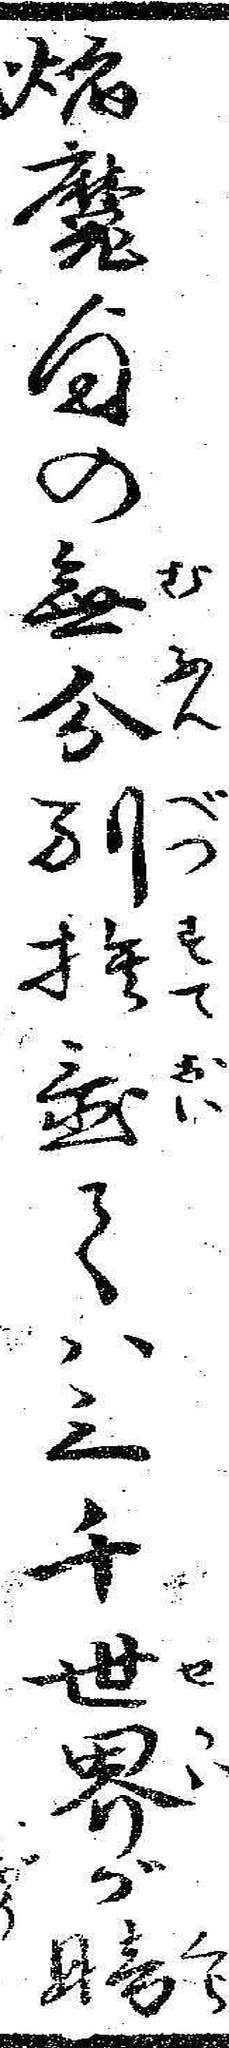焔魔様の無分別捨置ては三千世界が暗
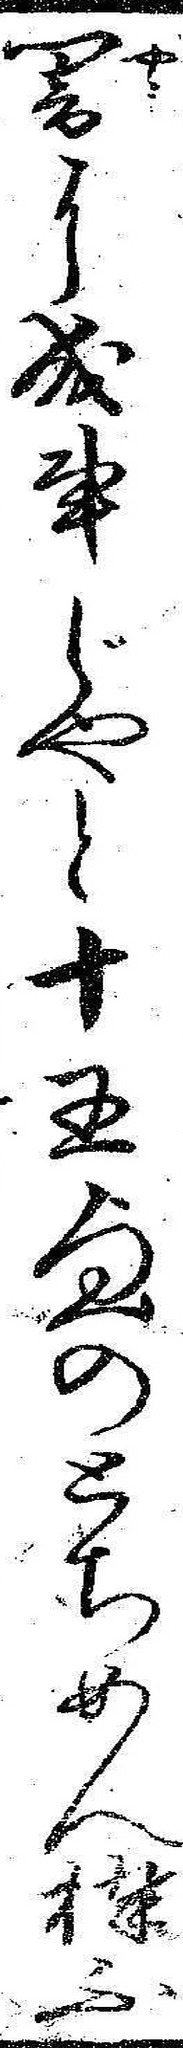闇に成事じやと十王様のとちめん棒ふ
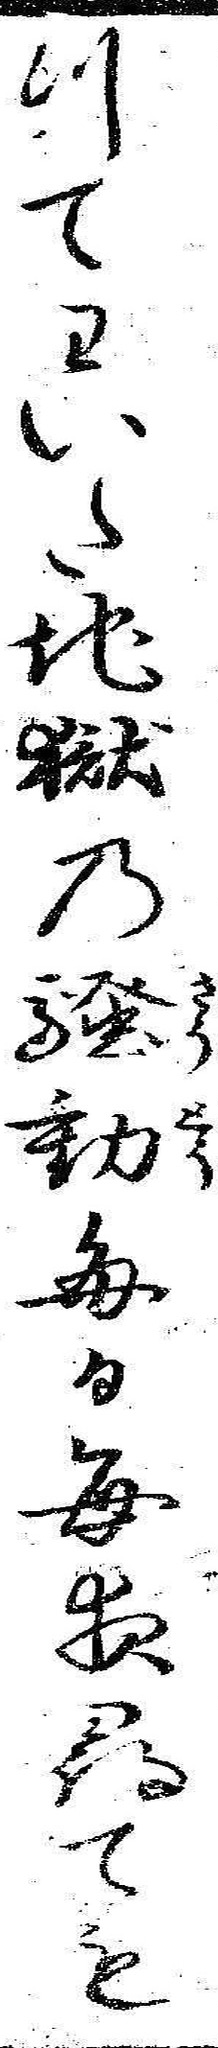つてわいた地獄の騒動毎日毎夜尋ても
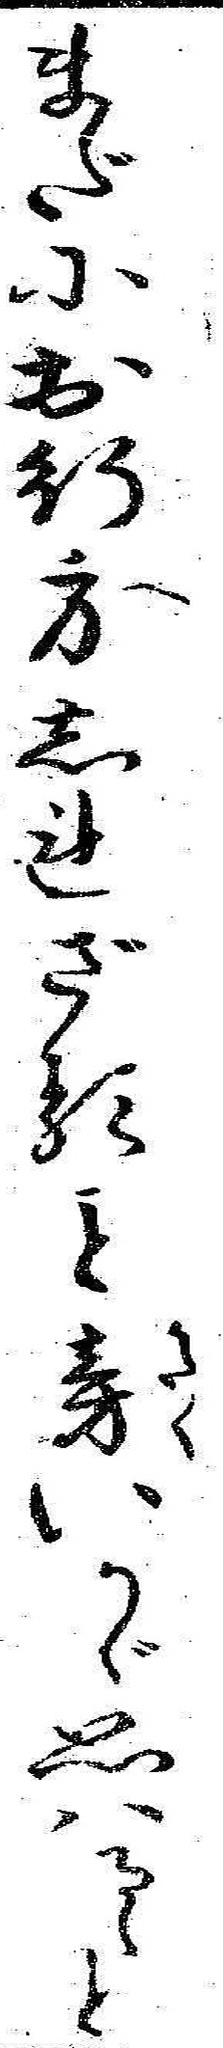まだにお行方しれざること旁いかゞ思はるゝと

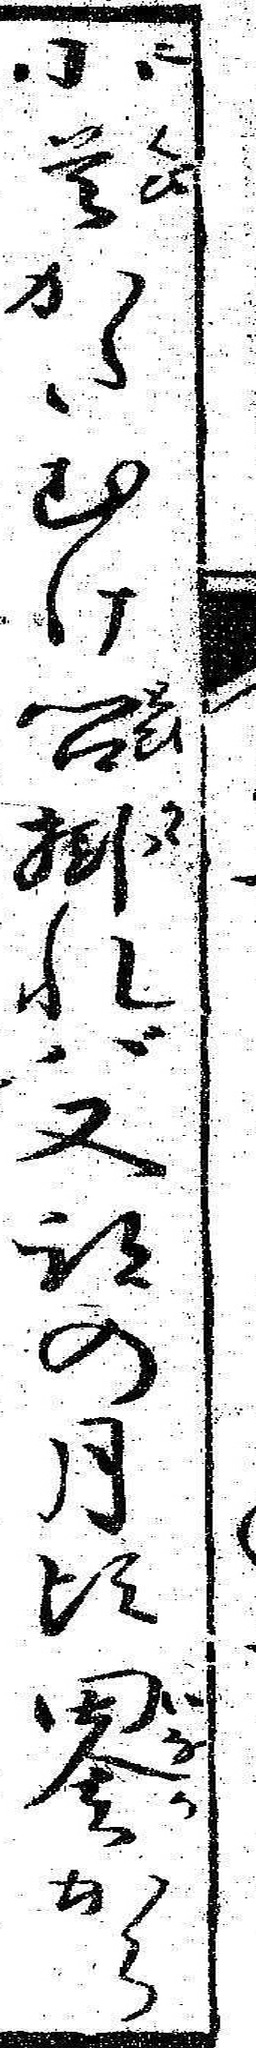小首かたむけ問掛れば又跡の月頃田舎から
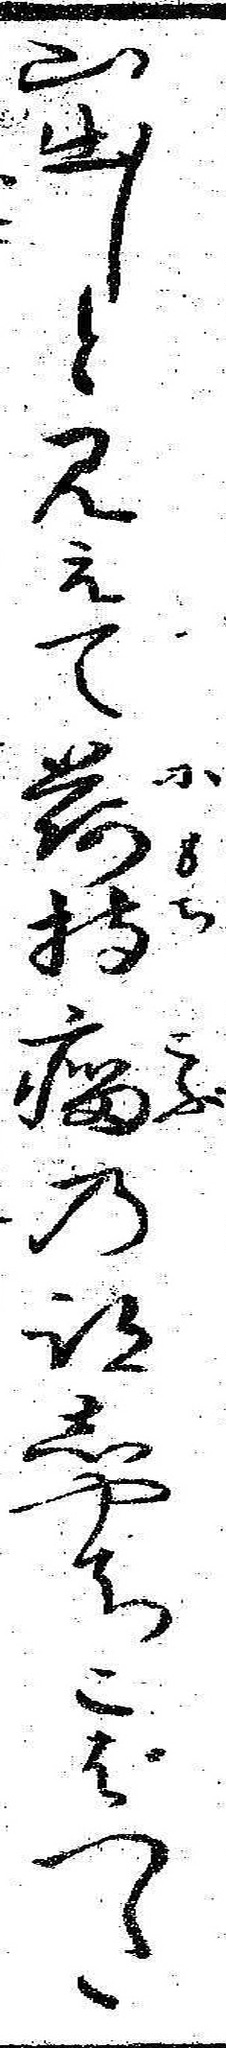山出しと見えて荷持瘤の跡しやちこばつた
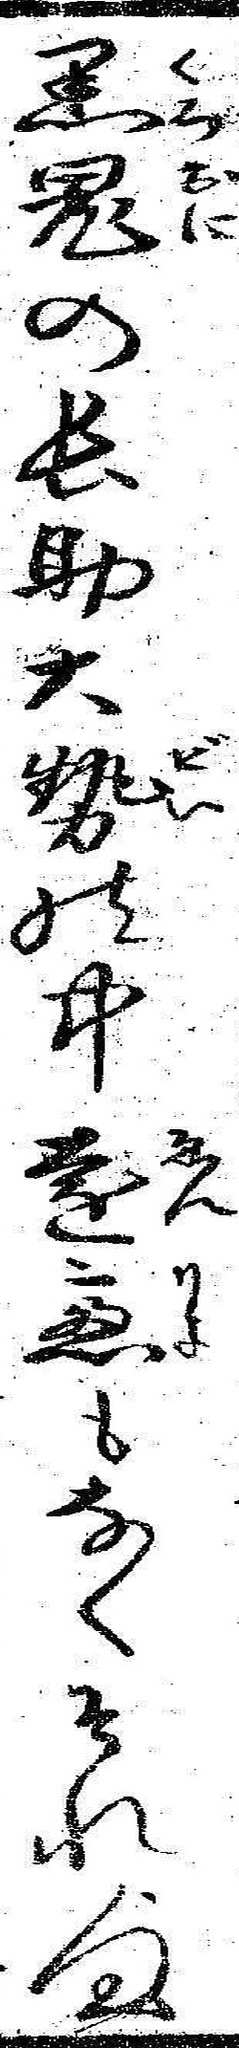黒鬼の長助大勢の中遠慮もなくそれ様
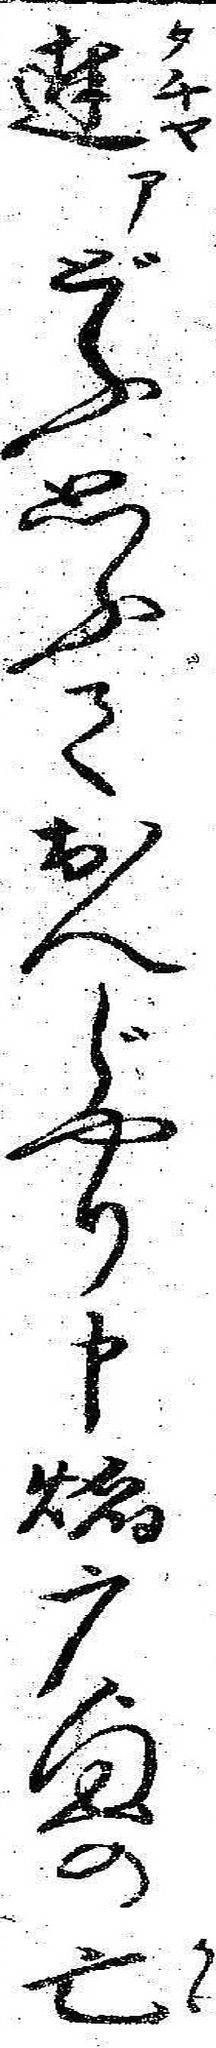達思ふておんじやり申焔魔様の亡
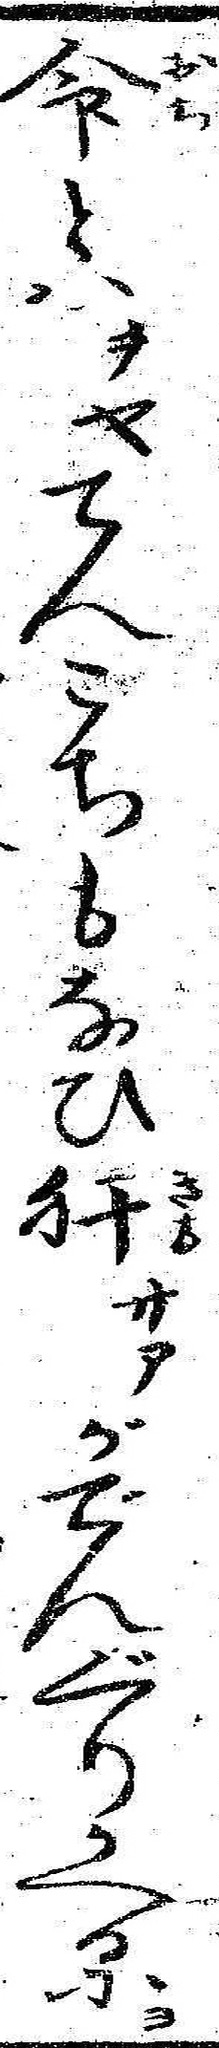命とは肝
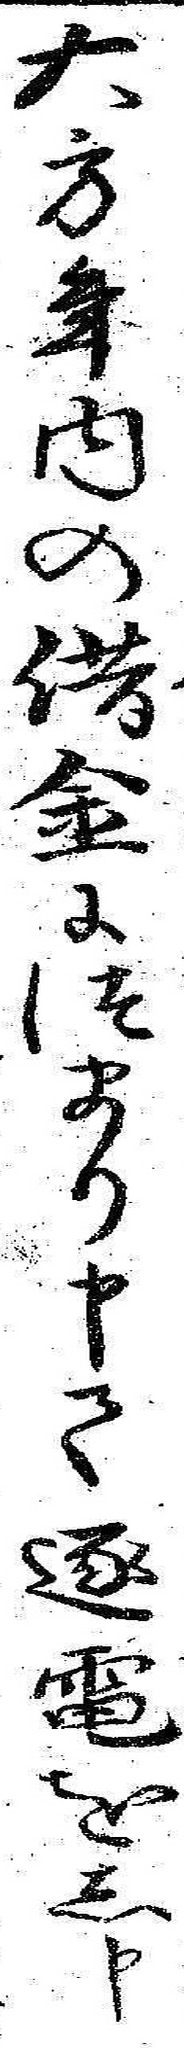大方年内の借金につまり申て逐電をし申
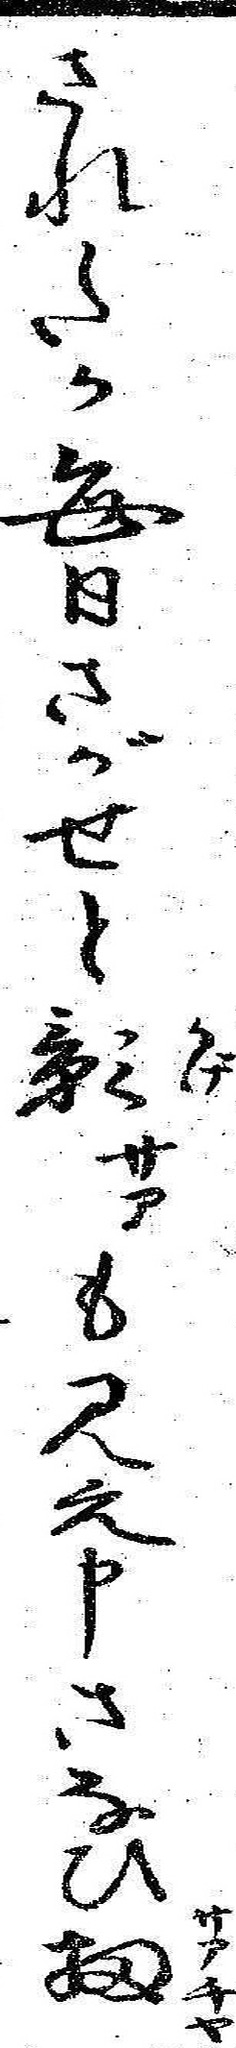されたか毎日さがせと影見え申さなひ扨
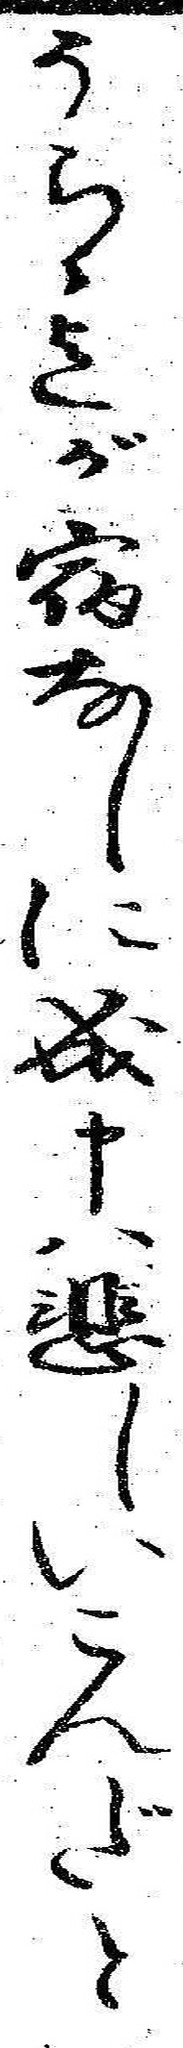うらゝ迄が宿なしに成申は悲しいこんだと
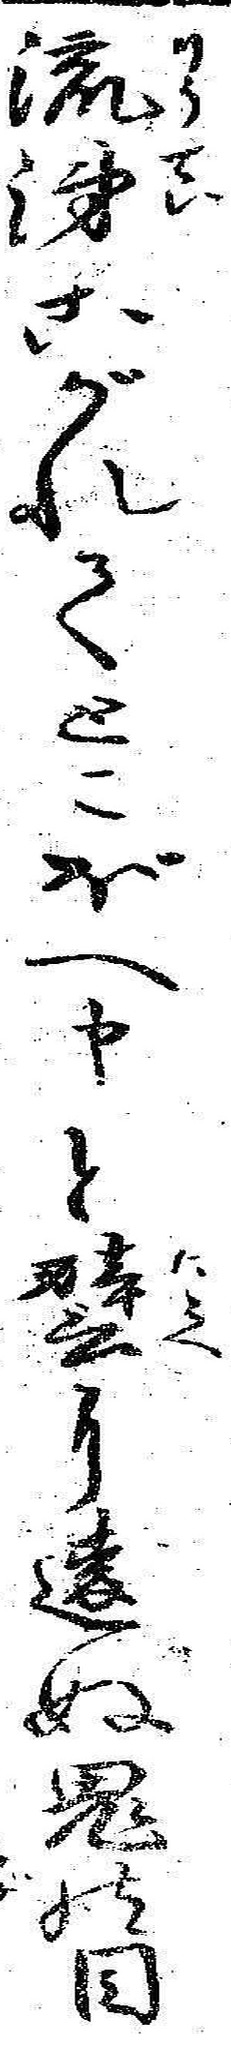流涕こがれてとこぼへ申と譬に違ぬ鬼の目
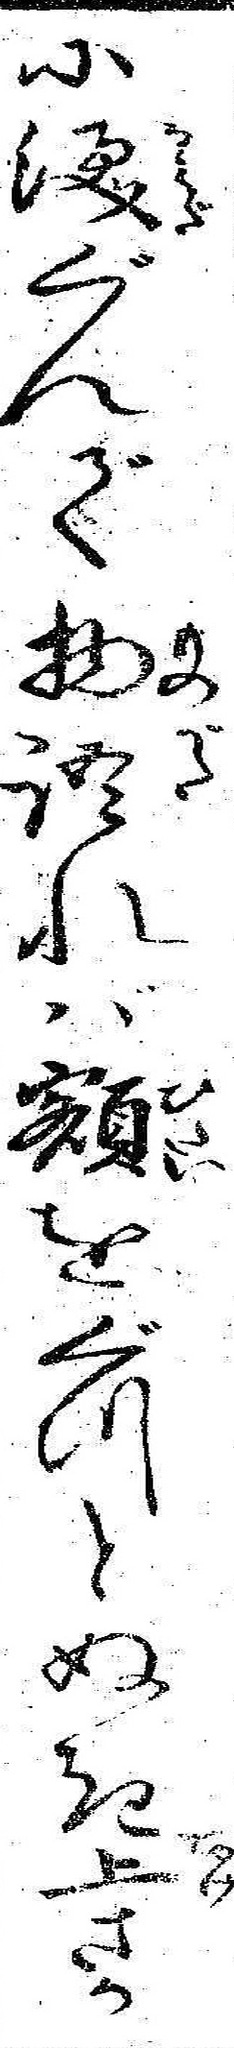に涙ぐんで物語れば額をぐつとぬき上さか
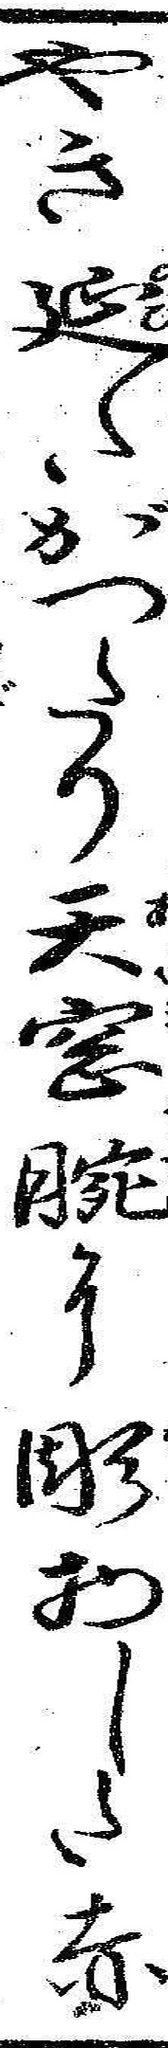やき延たがつたり天窓腕に彫物した赤
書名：根無草後編
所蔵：国文学研究資料館
